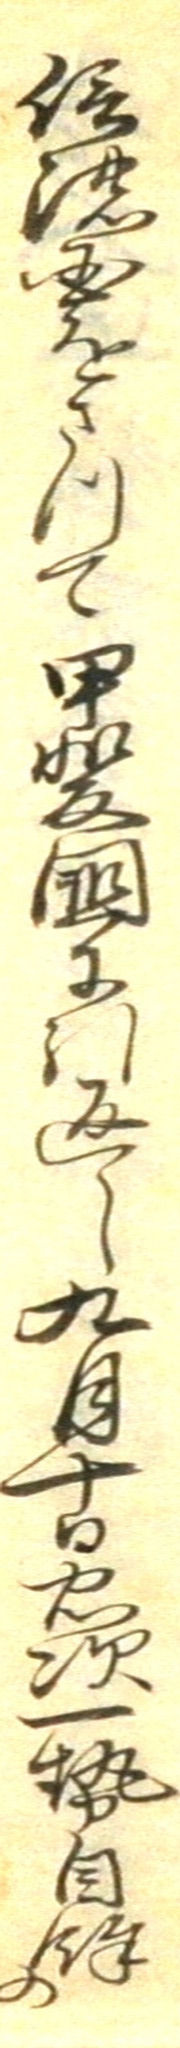信濃国をさつて甲斐国に引返し九月十日忠次一勢自余の
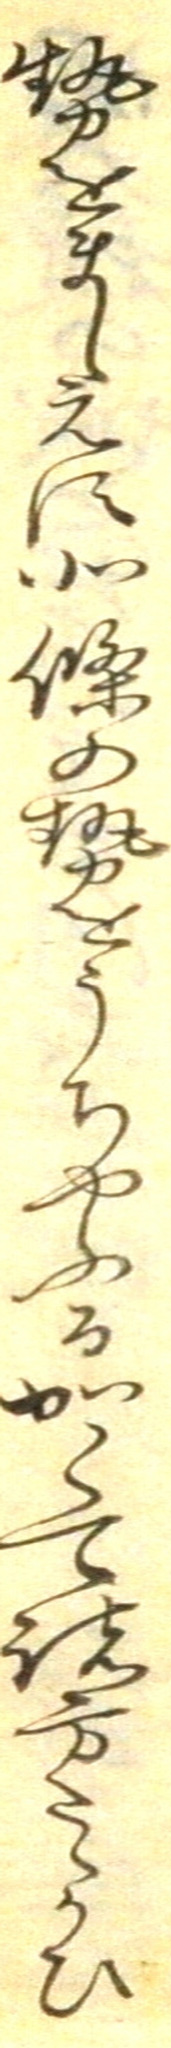勢をましえす北条の勢をうちやふるかくて諸方たゝかひ
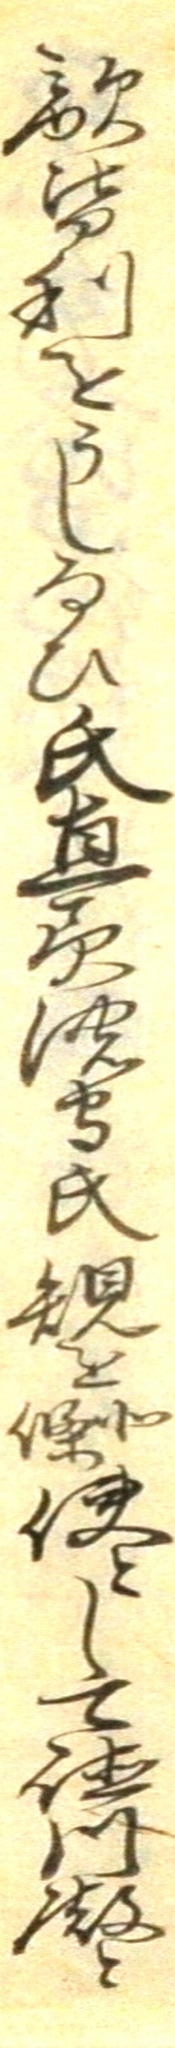敵皆利をうしなひ氏直美濃守氏規を北条使として徳川殿と
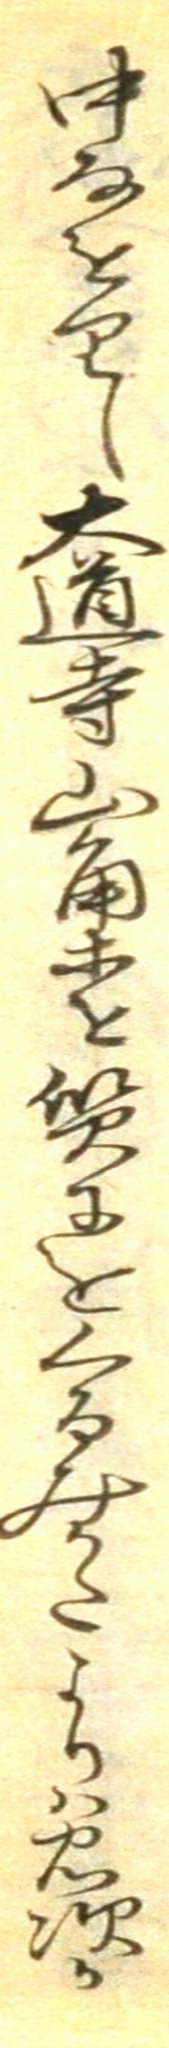中なをりし大道寺山角等を質にをくるみかたよりは忠次か
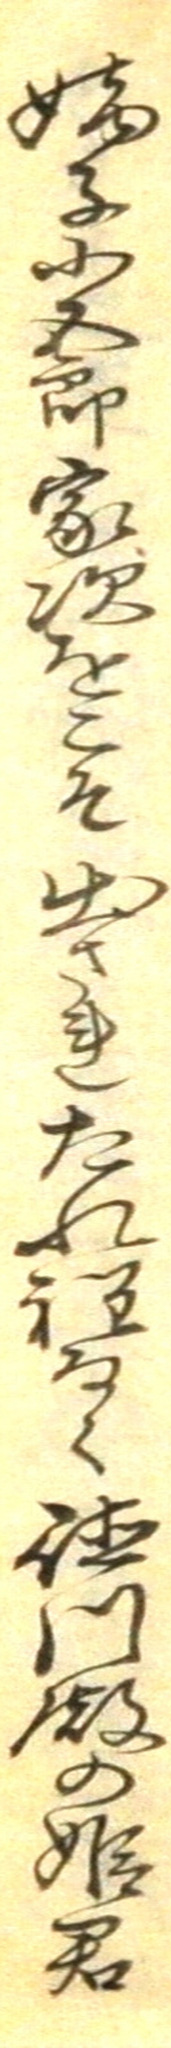嫡子小五郎家次をこそ出されたれ程なく徳川殿の姫君
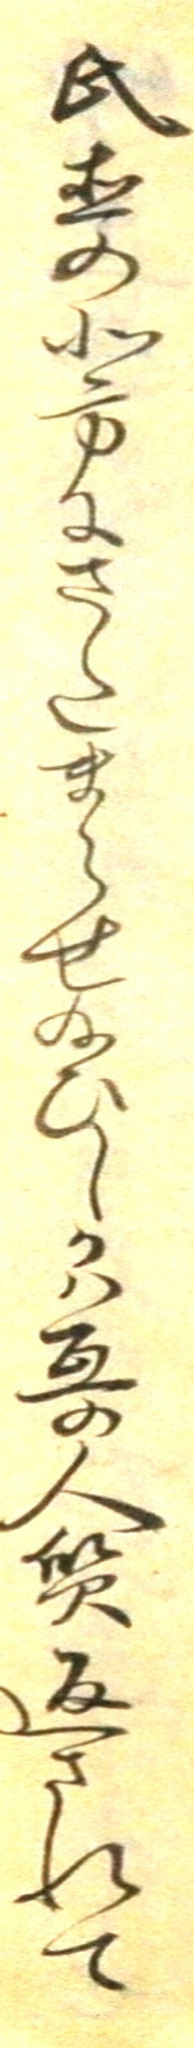氏直の北方にさたまらせ給ひしかは互の人質返されて

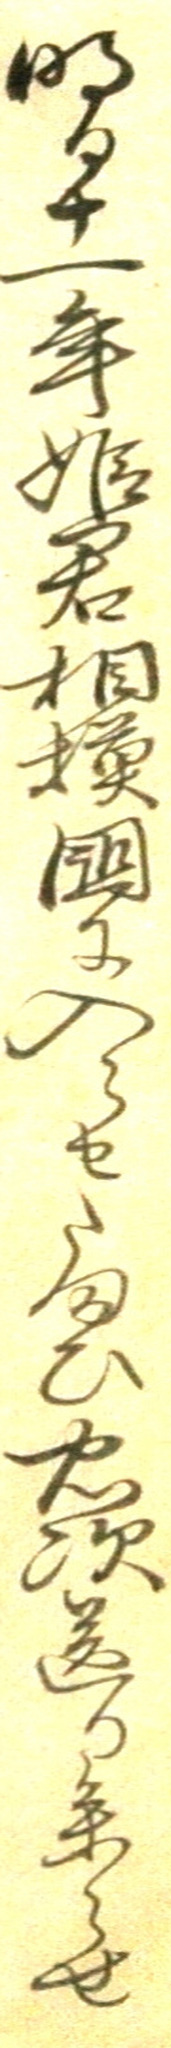明る十一年姫君相模国に入らせたまひ忠次送り参らせ
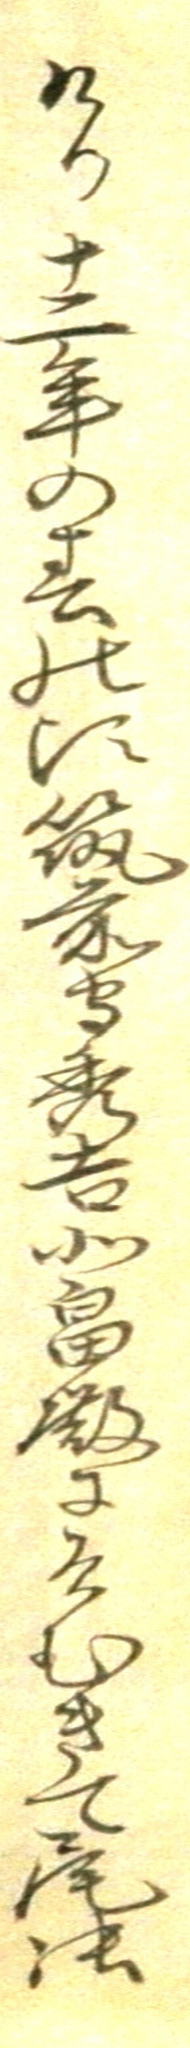けり十二年の春の頃筑前守秀吉北畠殿にそむきて尾張
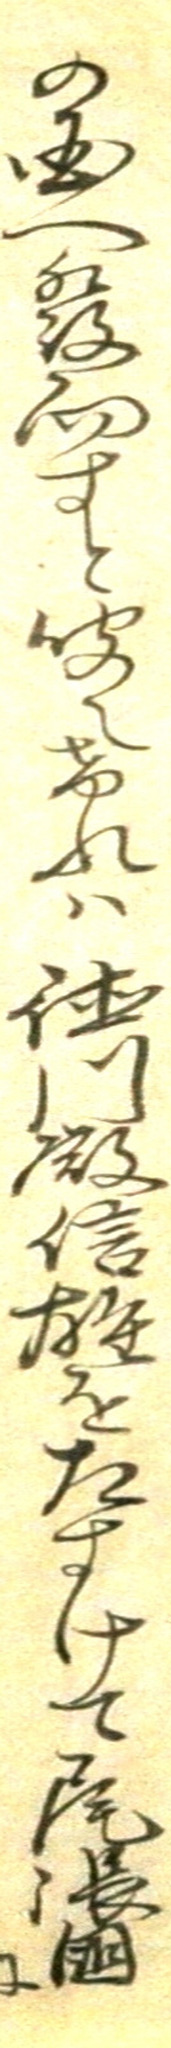の国へ発向すと聞えけれは徳川殿信雄をたすけて尾張国に
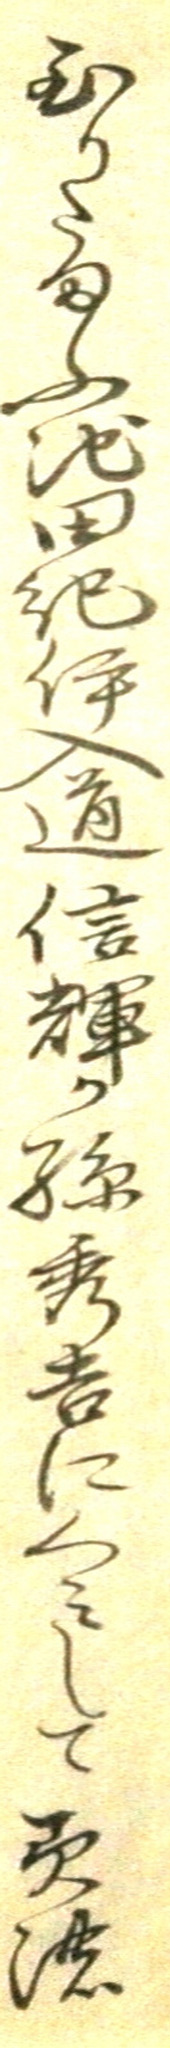至りたまふ池田紀伊入道信輝か孫秀吉にくみして美濃
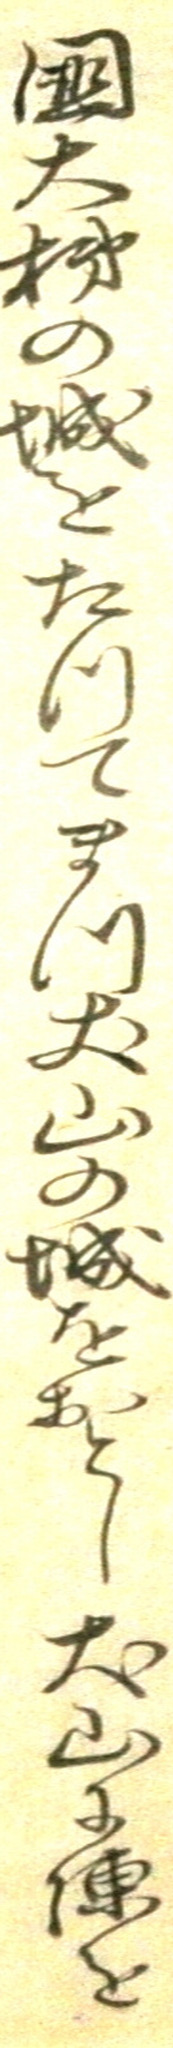国大柿の城をたつてまつ犬山の城をおとし犬山に陣を
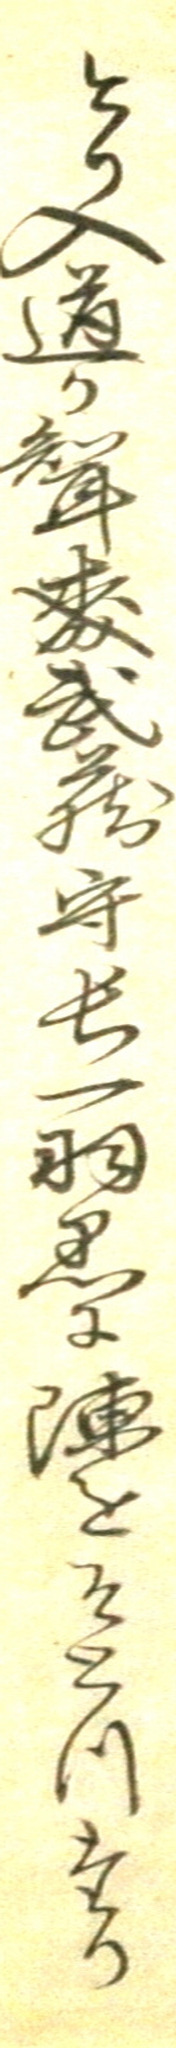とり入道か聟森武蔵守長一羽黒に陣をそとつたり
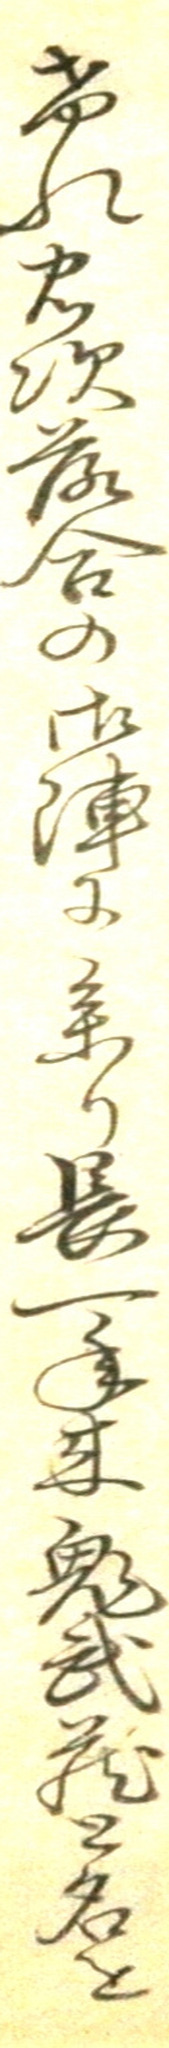けれ忠次落合の御陣に参り長一年来鬼武蔵と名を
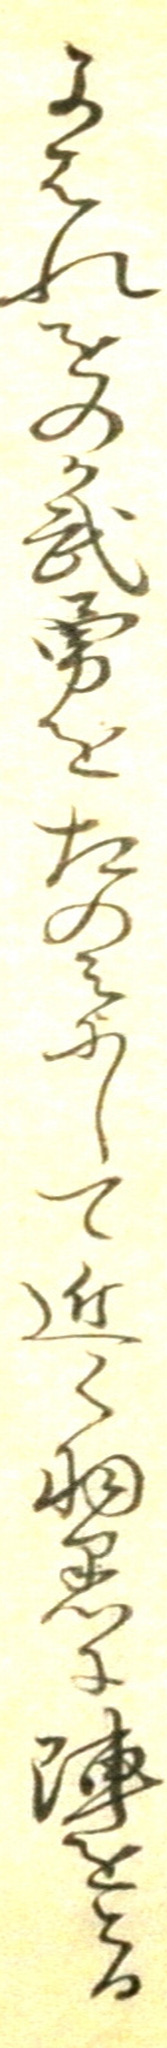よはれをのか武勇をたのみにして近く羽黒に陣をとる
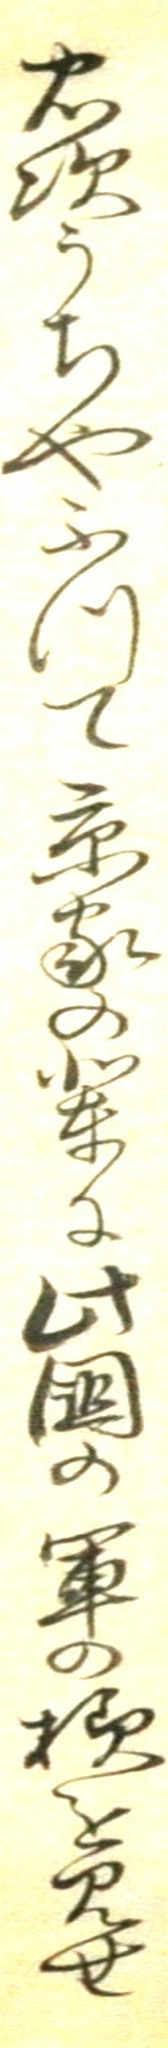忠次うちやふつて京家の輩に此国の軍の様を見せ
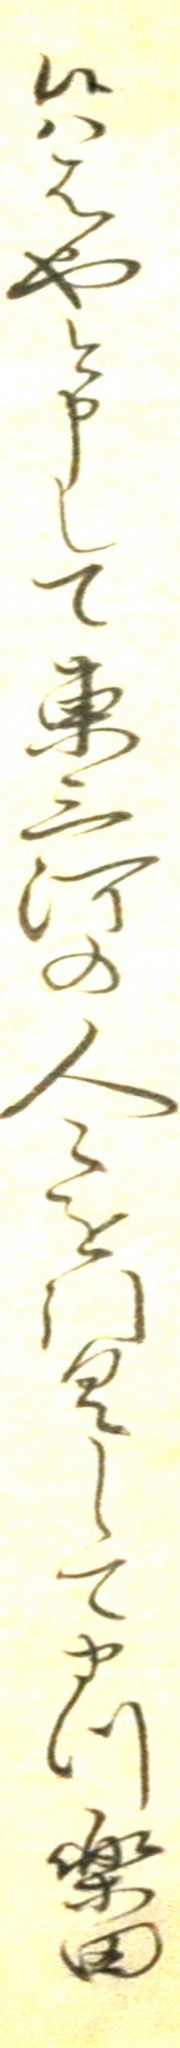候ははやと申して東三河の人々を引具してまつ楽田
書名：藩翰譜（四・上）
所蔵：伊那市立高遠町図書館・合同会社AMANE
